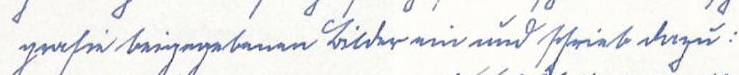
grafie beigegebenen Bilder ein und schrieb dazu:
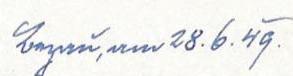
Bezau, am 28.6.49.
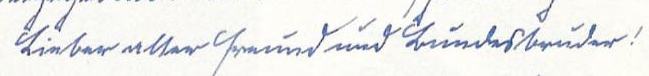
Lieber alter Freund und Bundesbruder!
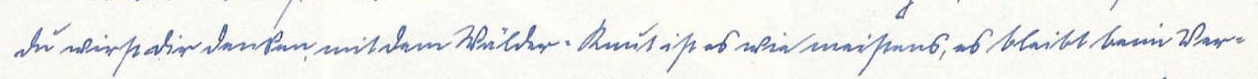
Du wirst dir denken, mit dem Wälder Knut ist es wie meistens, es bleibt beim Ver-
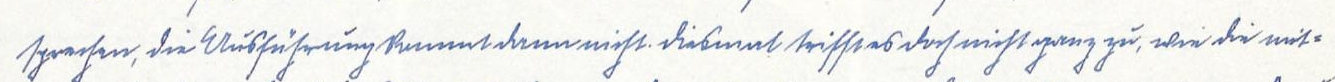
sprechen, die Ausführung kommt dann nicht. Diesmal trifft es doch nicht ganz zu, wie die mit-
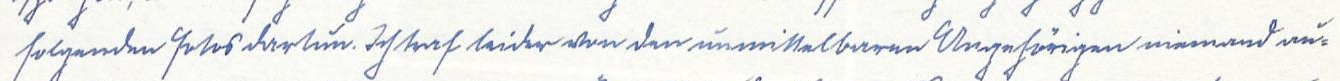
folgendem Fotos da tun. Ich traf leider von den unmittelbaren Angehörigen niemand au-
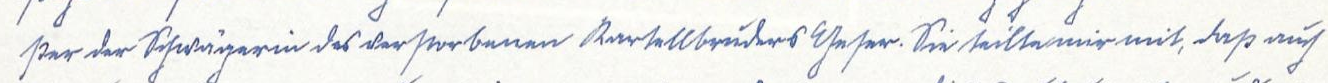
ßer der Schwägerin des verstorbenen Kartellbruders Geser. Sie teilte mir mit, daß auch
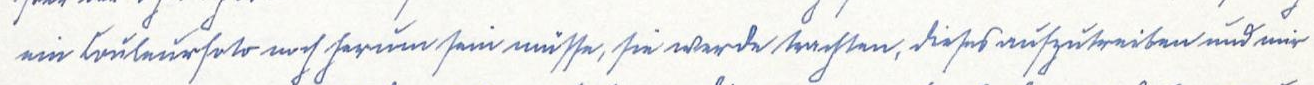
ein Couleurfoto noch herum sein müsste, sie werde trachten, dieses aufzutreiben und mir
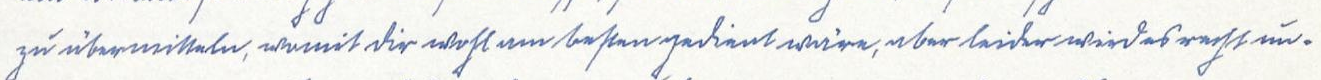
zu übermitteln, womit dir wohl am besten gedient wäre, aber leider wird dies recht un-
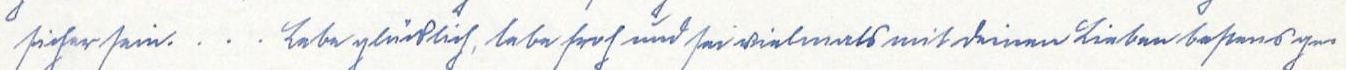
sicher sein… Lebe glücklich, lebe froh und sei vielmals mit deinen Lieben bestens ge-
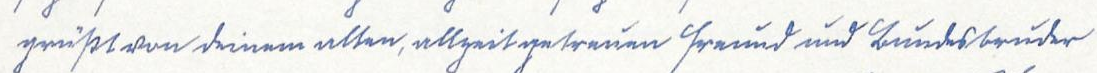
grüßt von deinem alten, allezeit getreuen Freund und Bundesbruder
